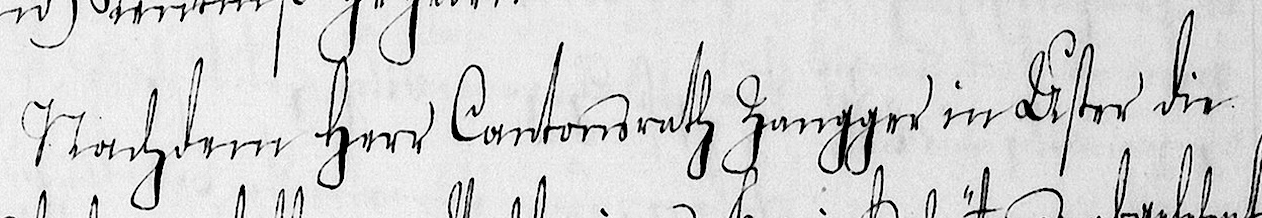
Nachdem Herr Cantonsrath Zangger in Uster die
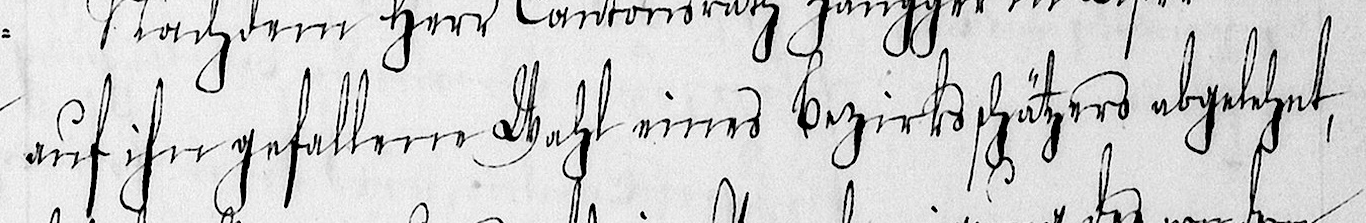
auf ihn gefallene Wahl eines Bezirksschätzers abgelehn¬
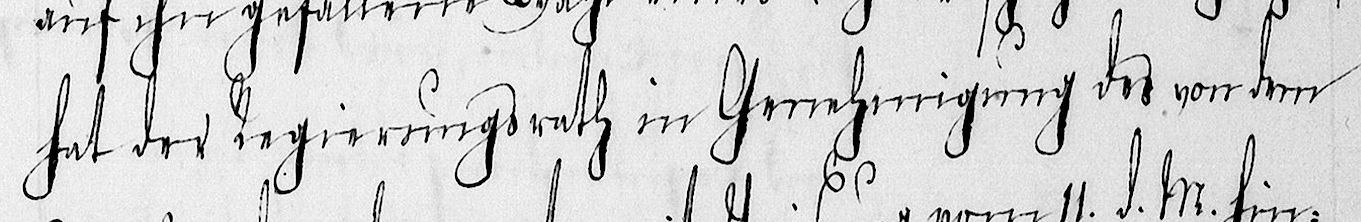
hat der Regierungsrath in Genehmigung des von dem
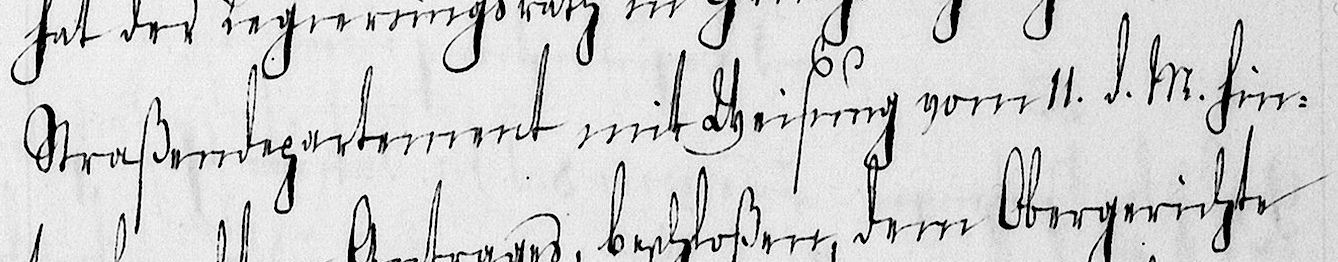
Straßendepartement mit Weisung vom 11. d. M. hin¬
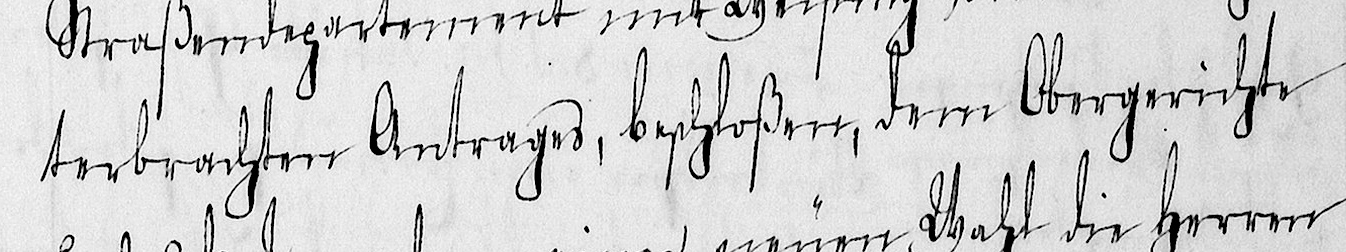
terbrachten Antrages, beschloßen, dem Obergerichte
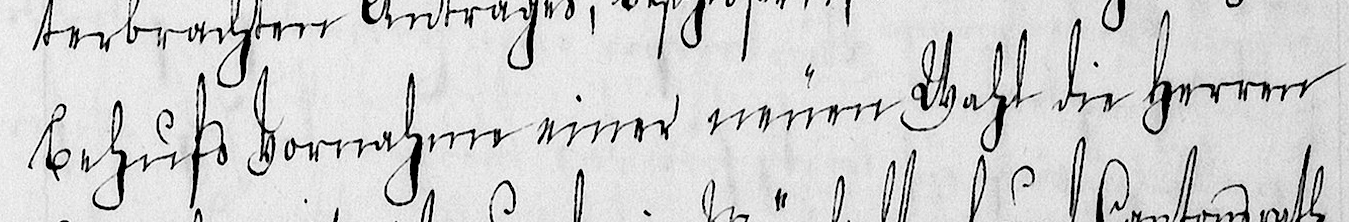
Behufs Vornahme einer neuen Wahl die Herren
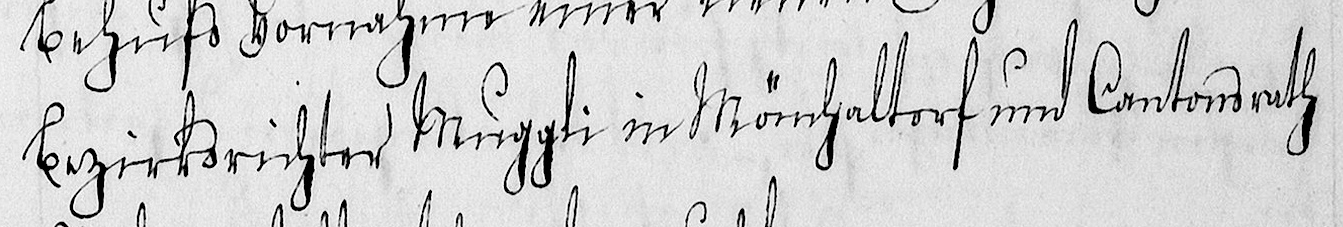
Bezirksrichter Muggli in Mönchaltorf und Cantonsrath
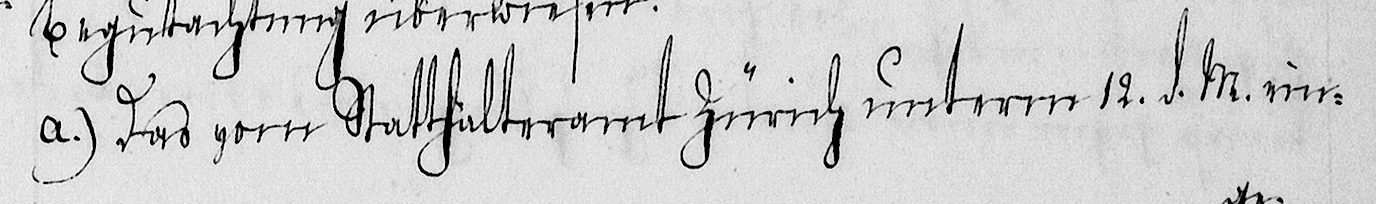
a.) Das vom Statthalteramt Zürich unterm 12. d. M. ein-
